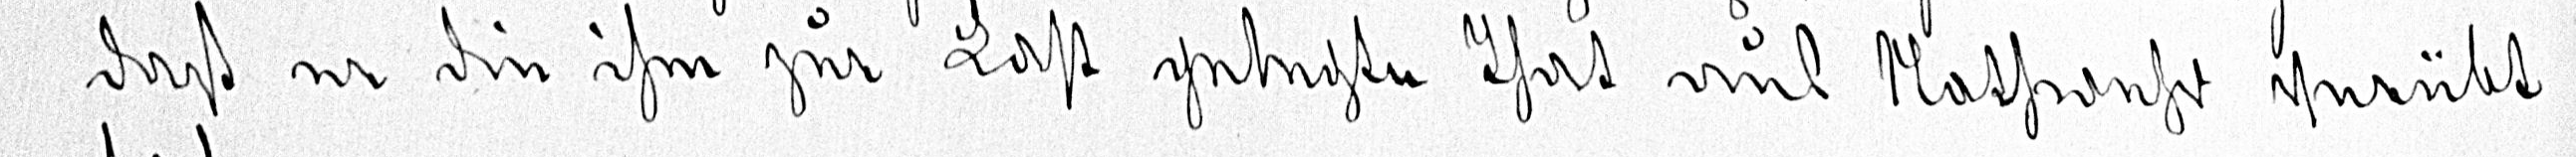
daß er die ihm zur Last gelegte That aus Nothwehr verübt
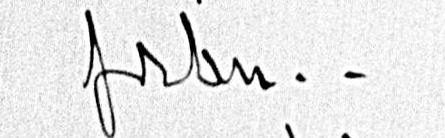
habe.
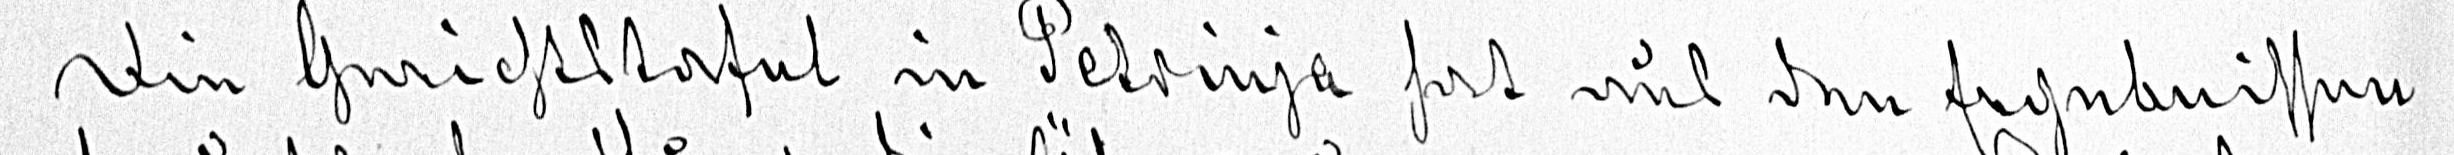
Die Gerichtstafel in Petrinja hat aus den Ergebnissen
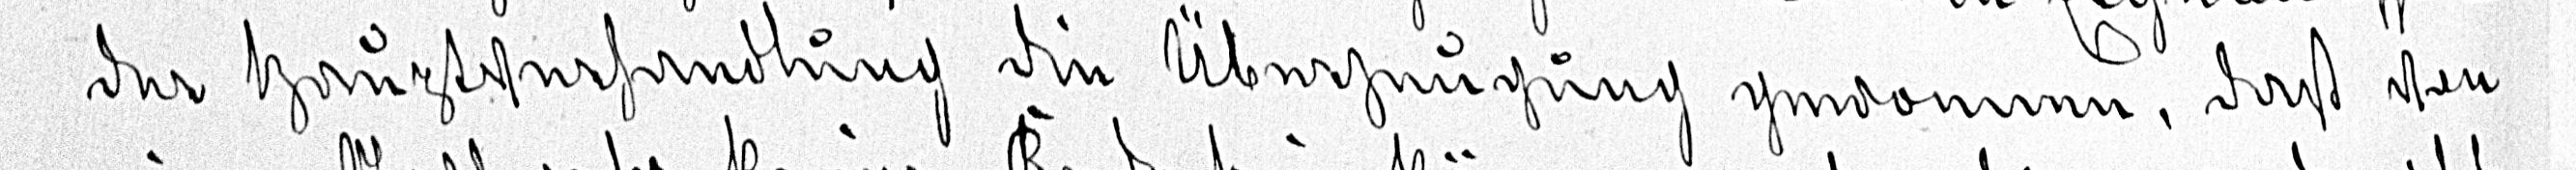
der Hauptverhandlung die Überzeugung gewonnen, daß von
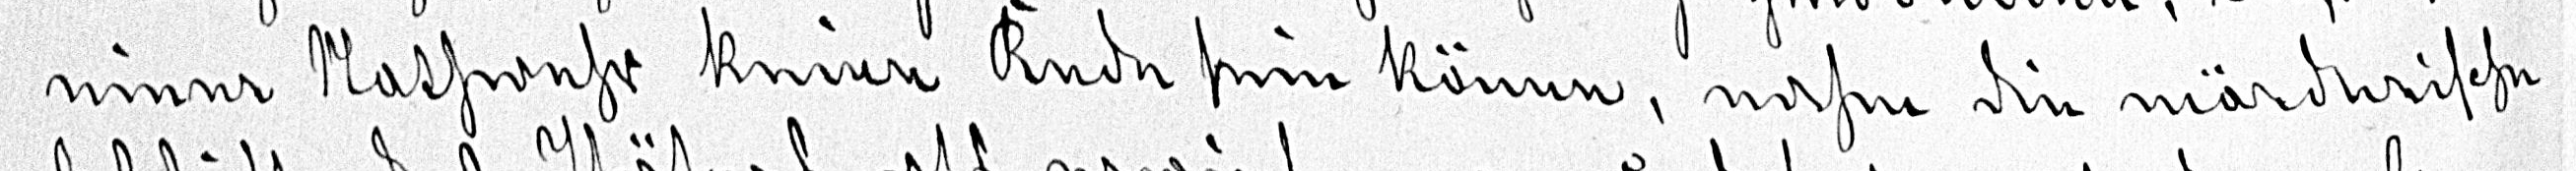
einer Nothwehr keine Rede sein könne, nahm die mörderische
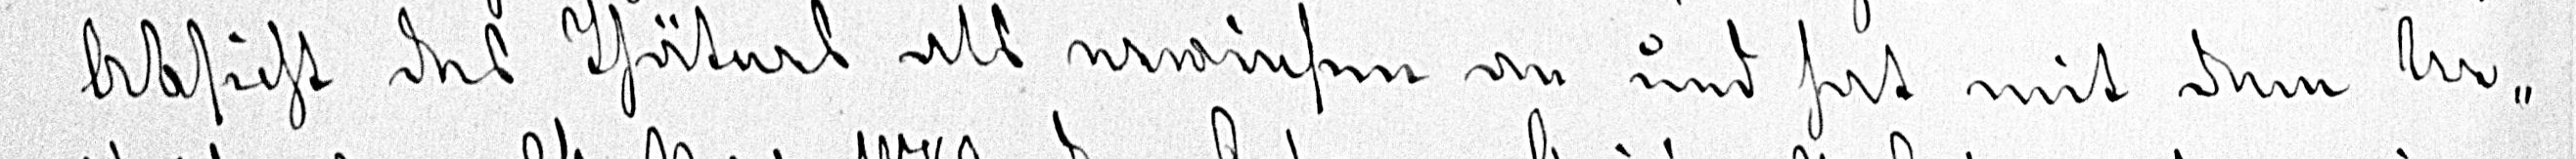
Absicht des Thäters als erwiesen an und hat mit dem Ur¬
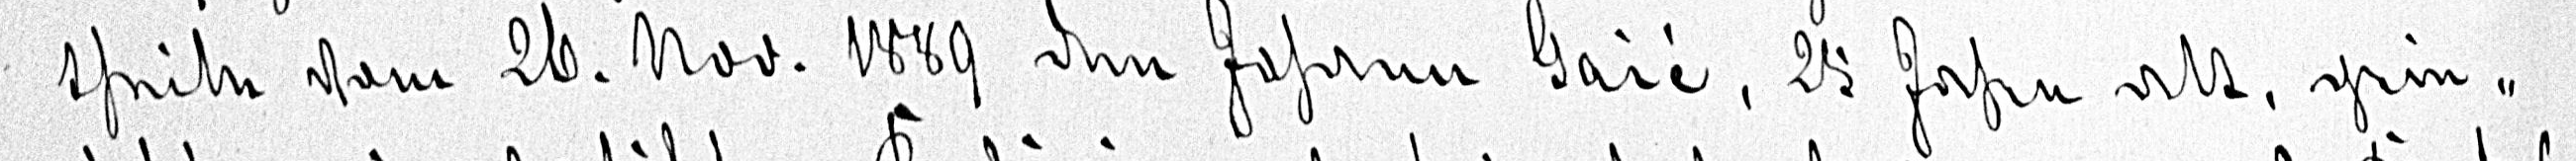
theile vom 26. Nov. 1889 den Johann Gaić, 25 Jahre alt, grie¬
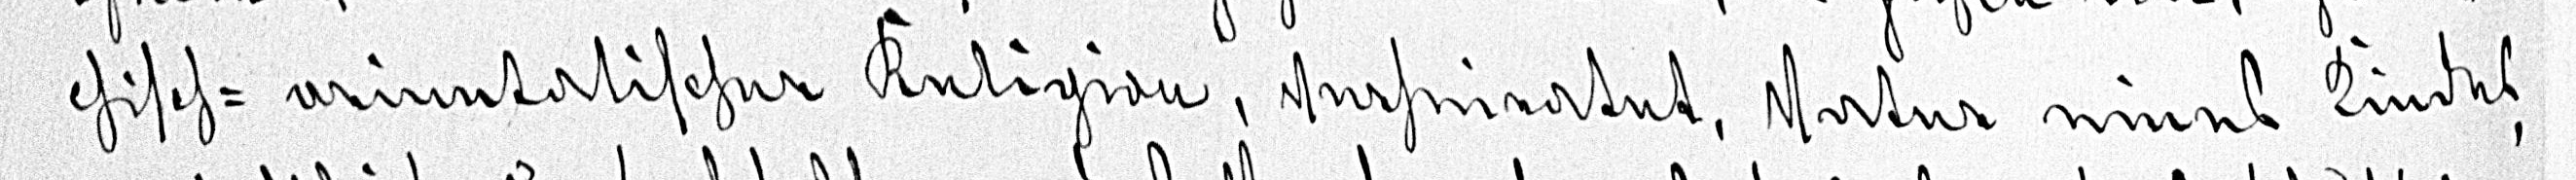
chisch- orientalischer Religion, verheiratet, Vater eines Kindes,
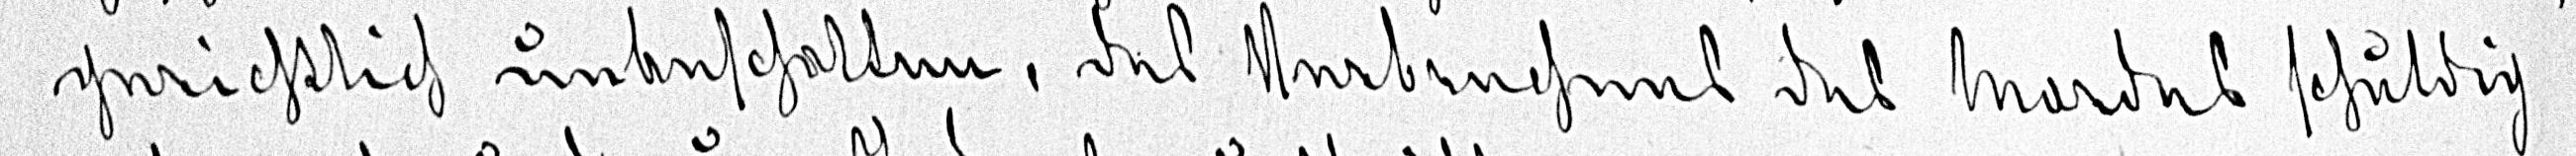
gerichtlich unbescholten, des Verbrechens des Mordes schuldig
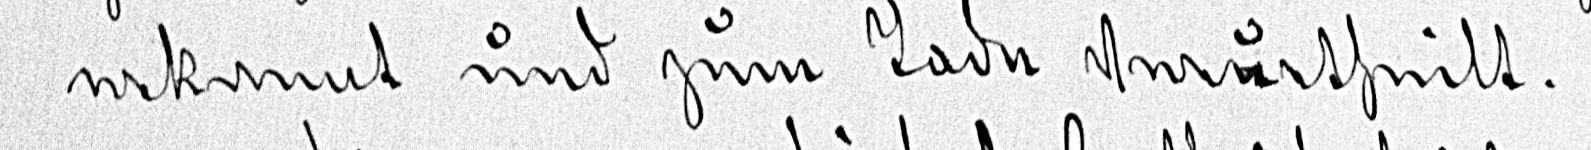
erkannt und zum Tode verurtheilt.
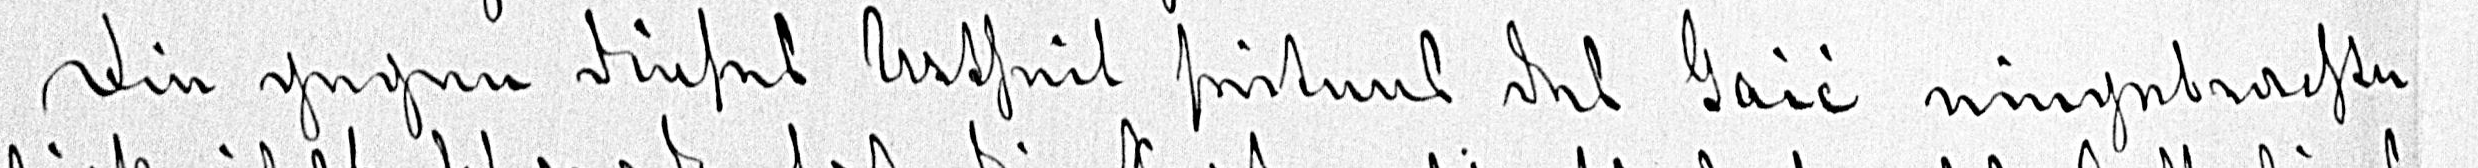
Die gegen dieses Urtheil seitens des Gaić eingebrachte
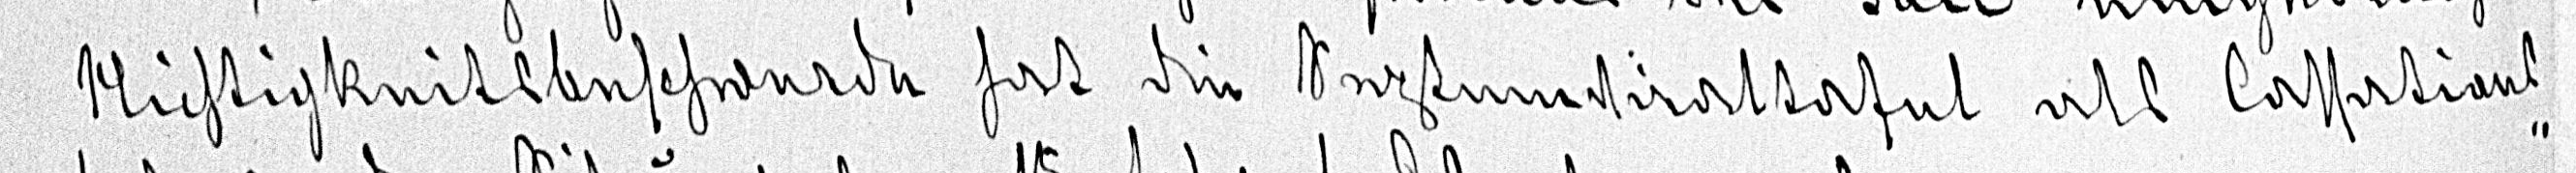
Nichtigkeitsbeschwerde hat die Septemviraltafel als Cassations¬
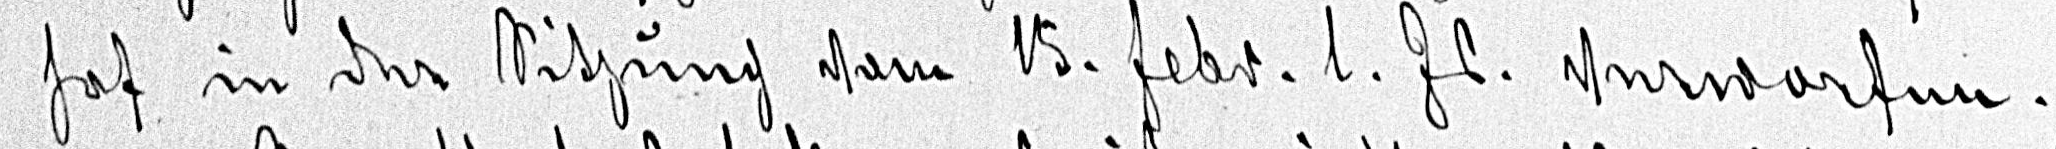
hof in der Sitzung vom 15. Febr. l. Js. verworfen.
